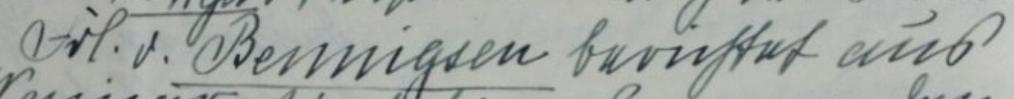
Frl. v. Bennigsen berichtet aus
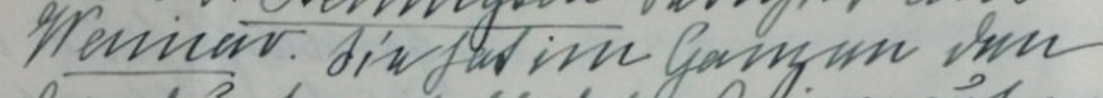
Weimar. Sie hat im Ganzen den
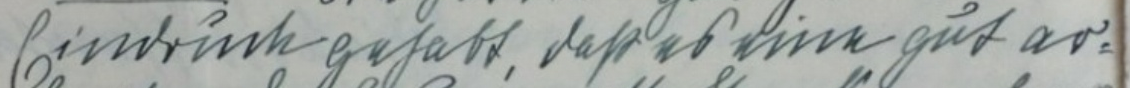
Eindruck gehabt, daß es eine gut ar
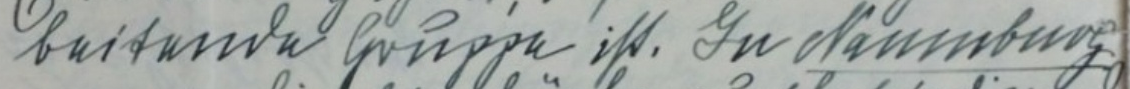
beitende Gruppe ist. In Naunburg
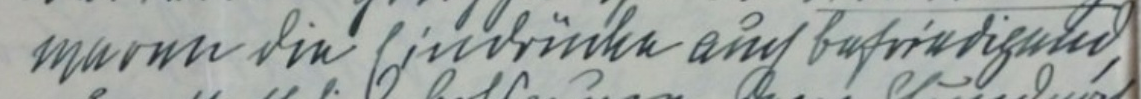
waren die Eindrücke auch befriedigend
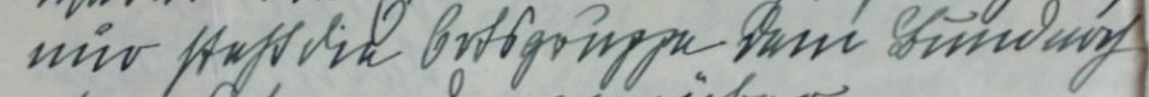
nur steht die Ortsgruppe dem Bund auch
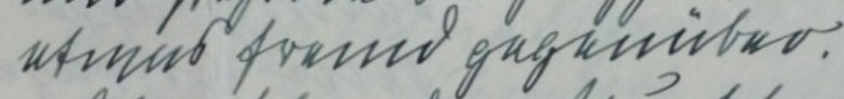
etwas fremd gegenüber.
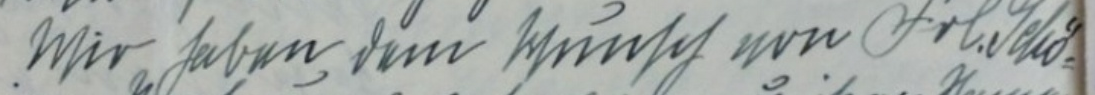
wir haben den Wunsch von Frl. Schö
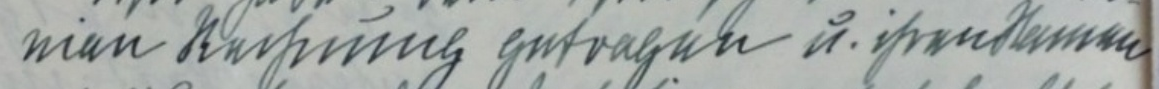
nian Rechnung getragen u. ihren Namen
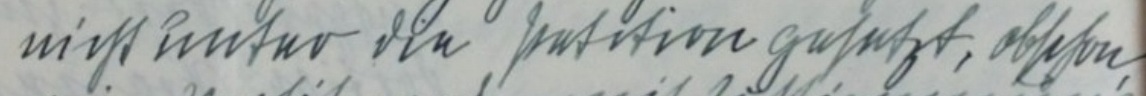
nicht unter die Petition gesetzt, obschon
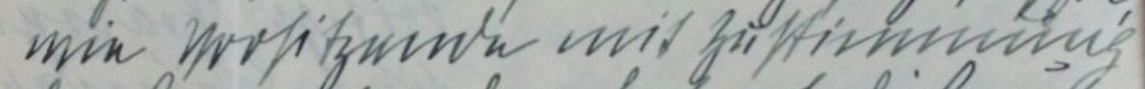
wie Vorsitzende mit Zustimmung
